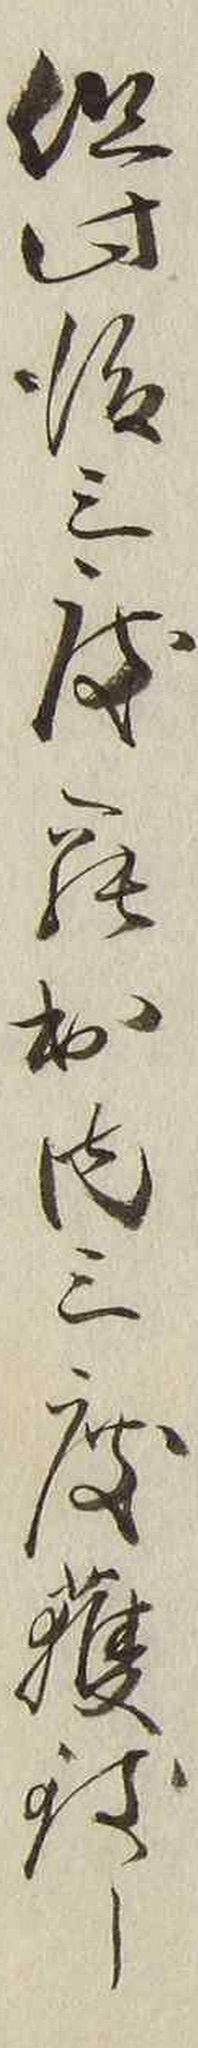但此後三度罷出内三度獲致し

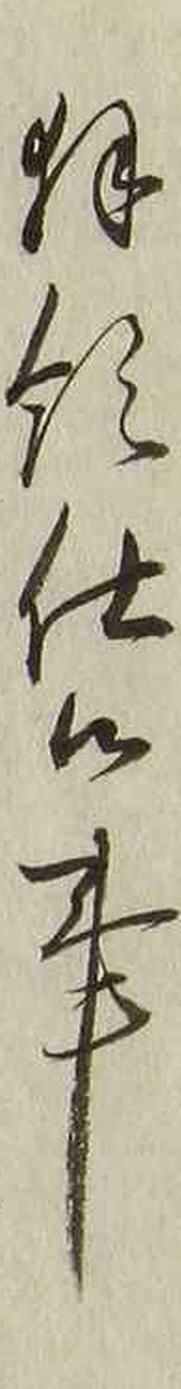拝領仕候事
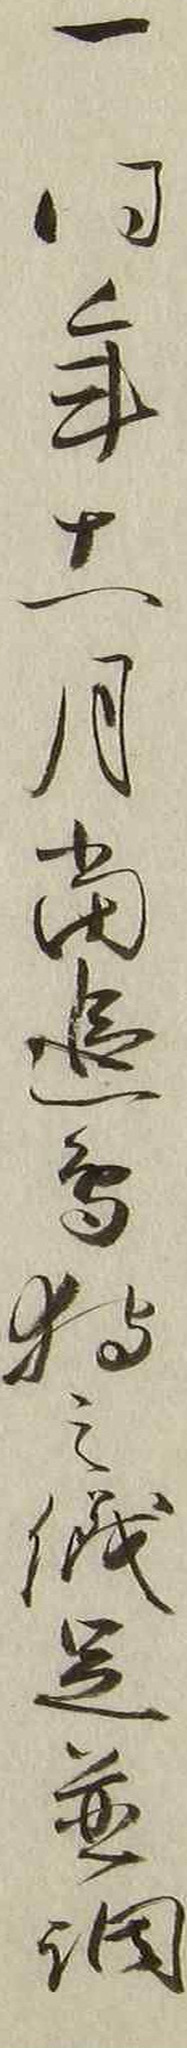一同年十一月当追鳥狩之儀足並調
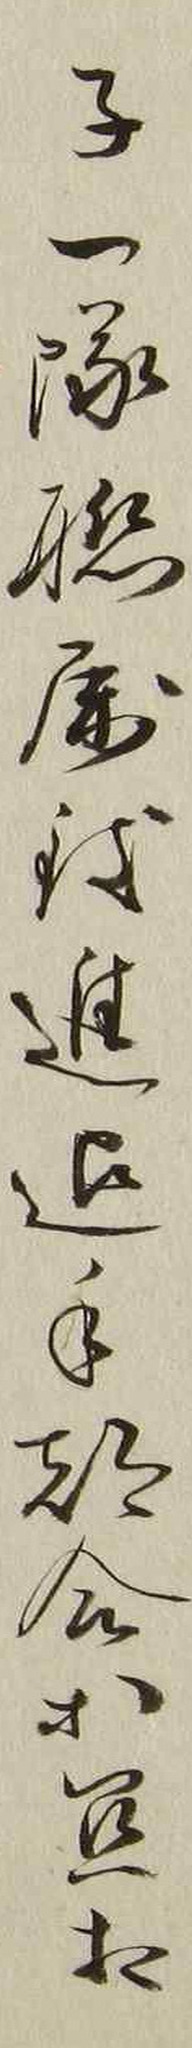子一隊聯属致進退手都合等宜相
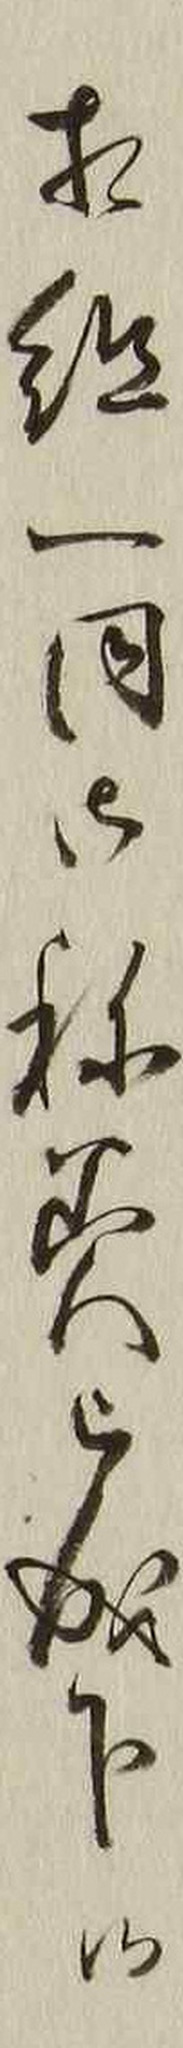相組一同御賞美被成下候
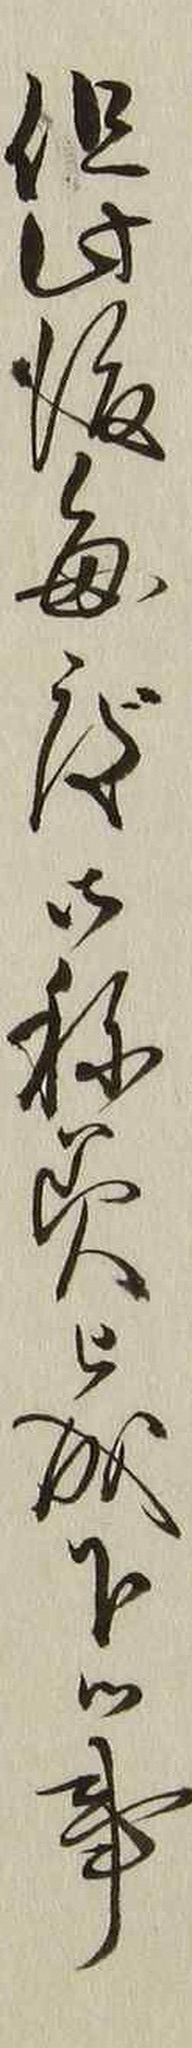但此後毎度御賞美被成下候事
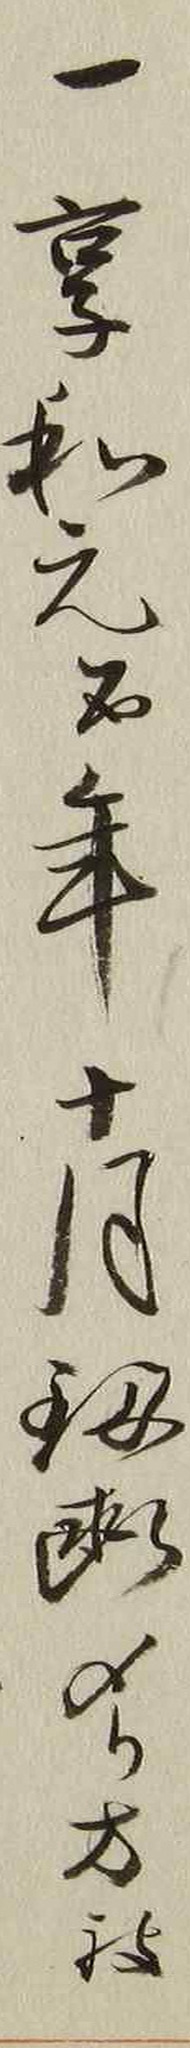一享和元酉年十月釼術〆り方被
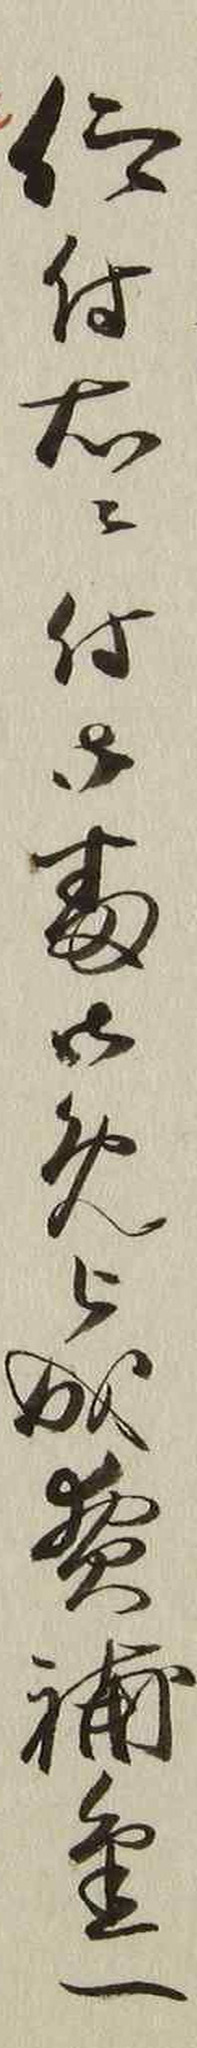仰付右ニ付御番御免被成費補金一
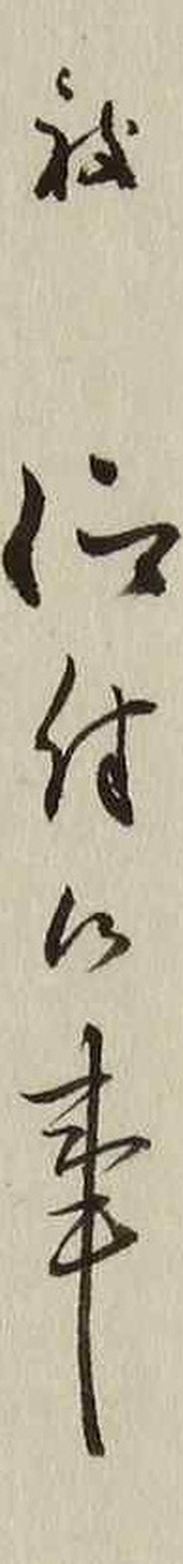被仰付候事
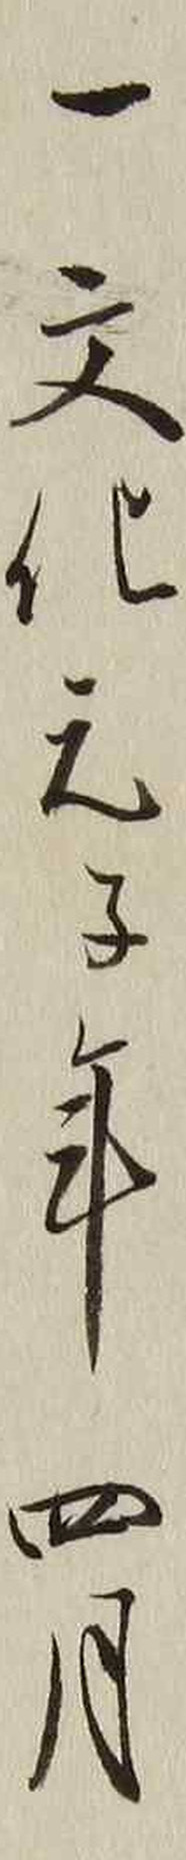一文化元子年四月
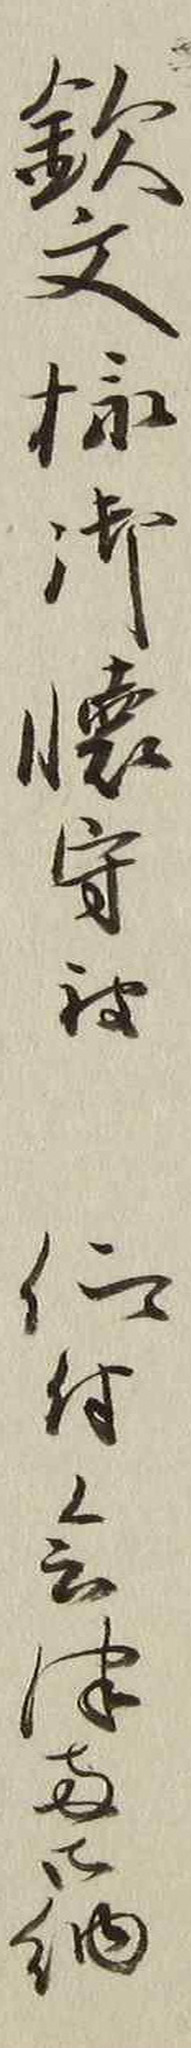欽文様御懐守被仰付会津両御納
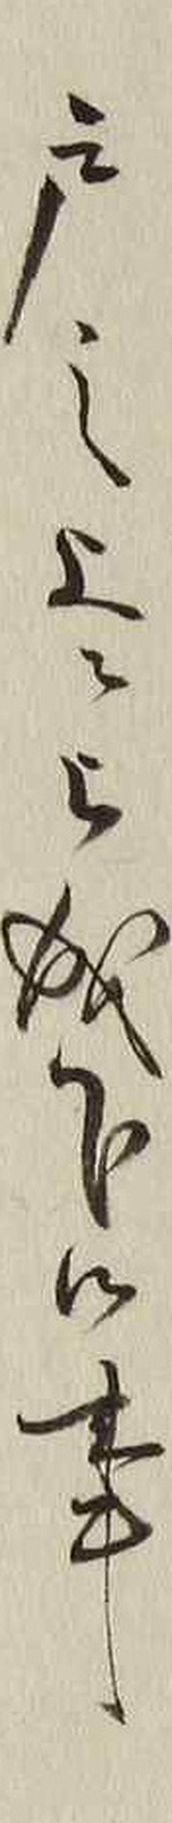戸之上ニ被成下候事
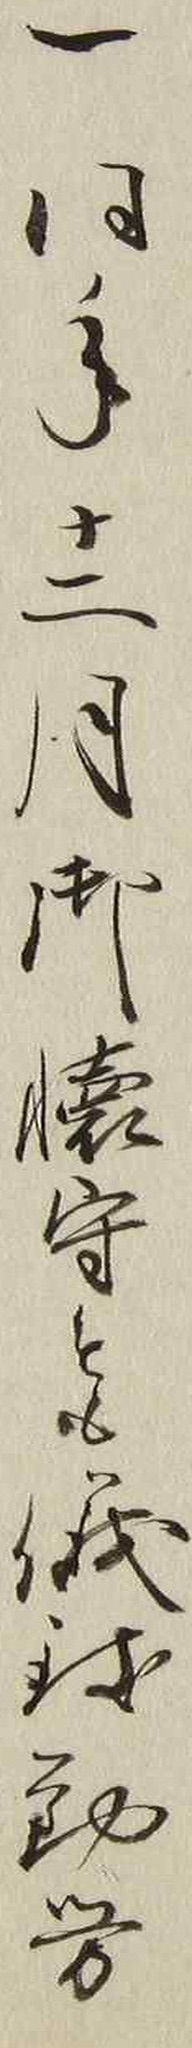一同年十二月御懐守とも儀致勤労
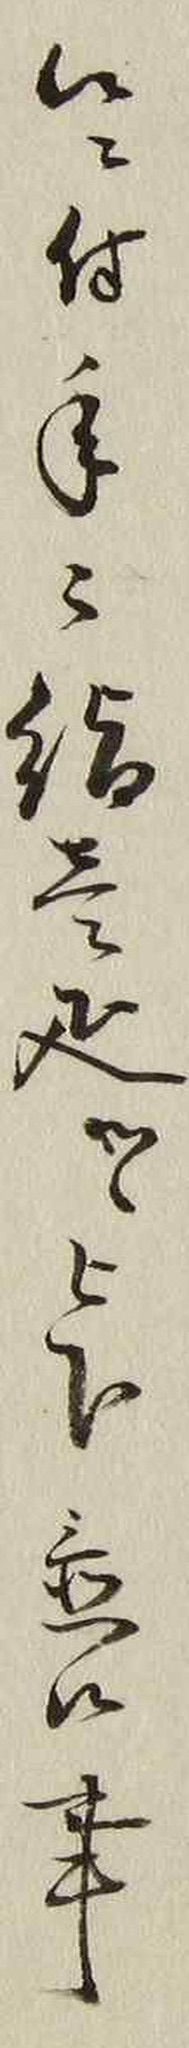候ニ付年々絹壱疋ツヽ被下置候事
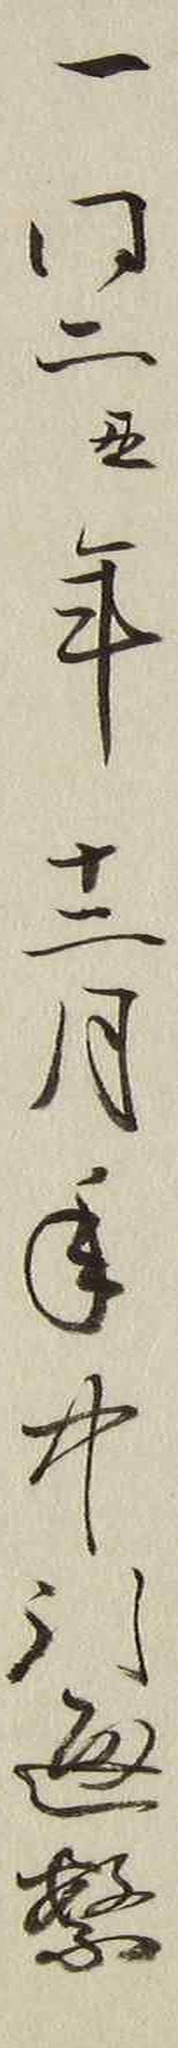一同二丑年十二月年中引通繫
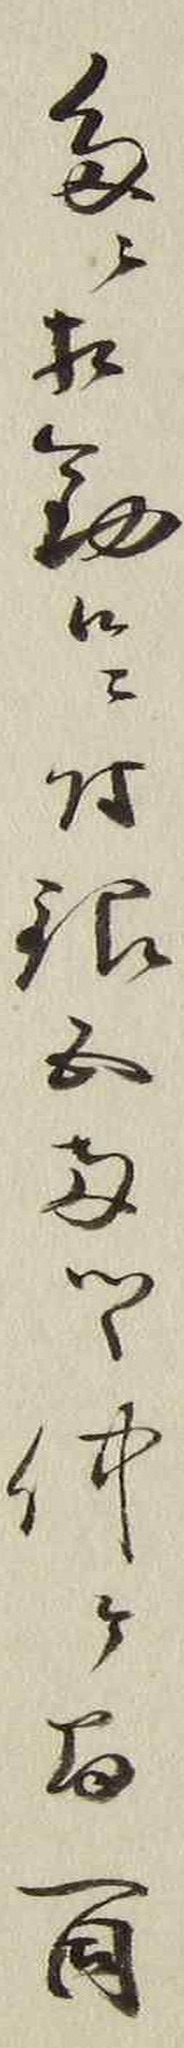多ニ相勤候ニ付銀五両ツヽ仲ヶ間一同
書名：諸士系譜　巻之163　な之部5
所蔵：会津若松市立会津図書館
